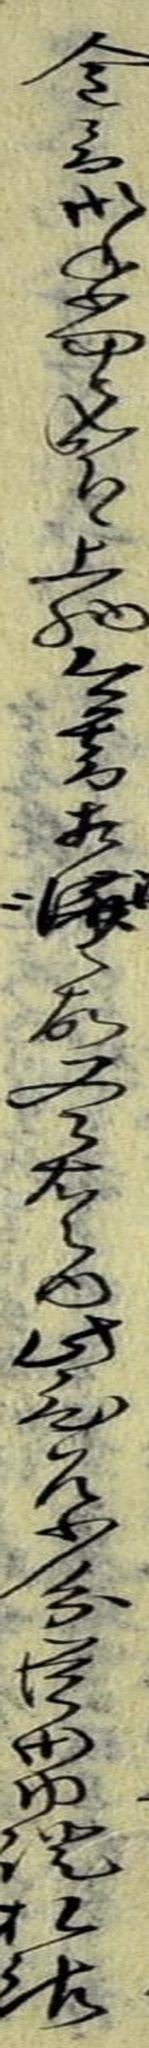金に而御手当被成下候上納今暮相満之故又々右之内此度乍少分従御内証札銀
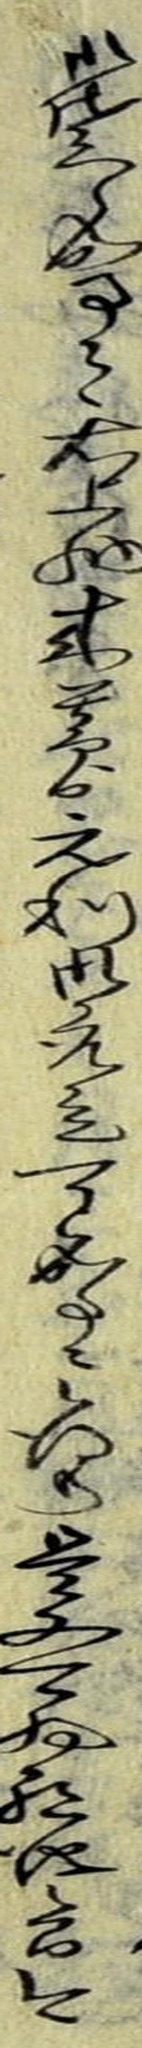御貸成事に候右上納来暮ゟ元利御取立可被成事に候得共是又可為難儀之間今
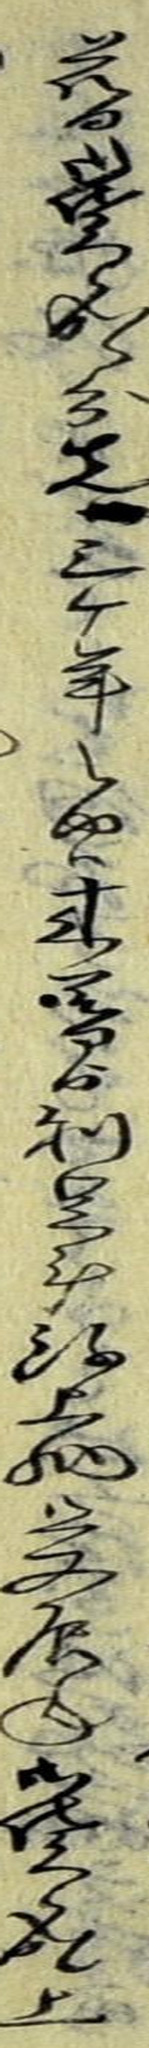暮御貸被成候分先三ヶ年之内は来暮ゟ利足斗致上納且又辰年御貸被成候上
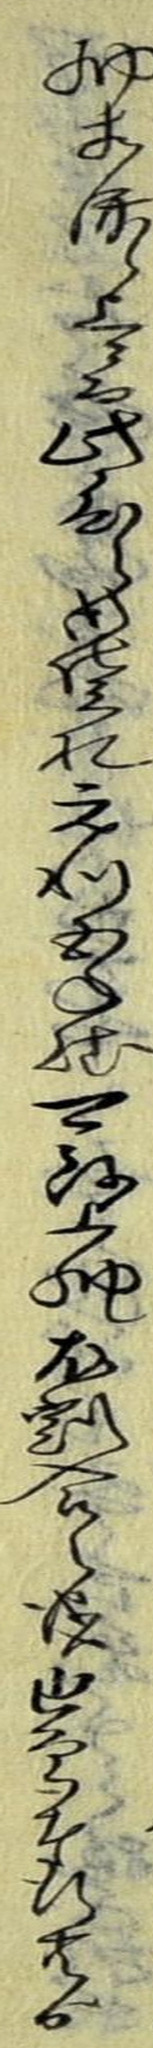納相済候上に而此度之御貸札元利五年賦可致上納候尤割合之儀は追而御奉行共ゟ

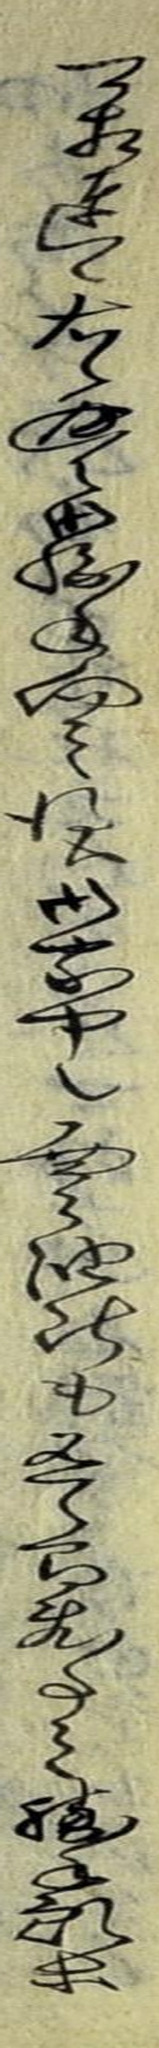可相達候右之通之御勝手向に候得は御家中之面々油断も有之間敷事に候勝手願等
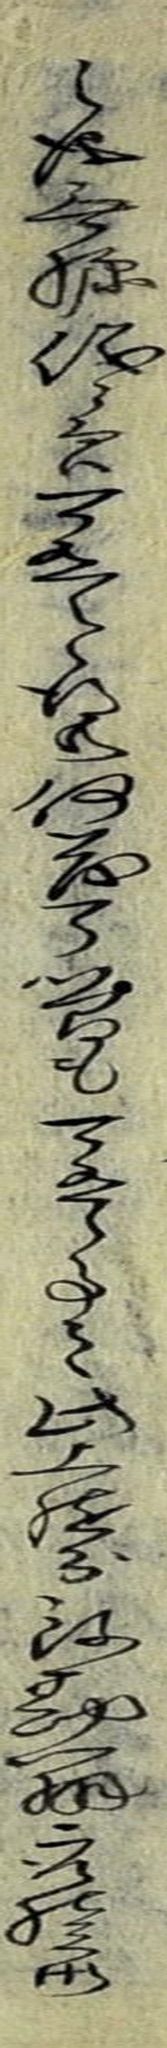之儀無拠儀に而は可有之候得共何茂了簡も可有之事に候此上随分致勘弁取続御
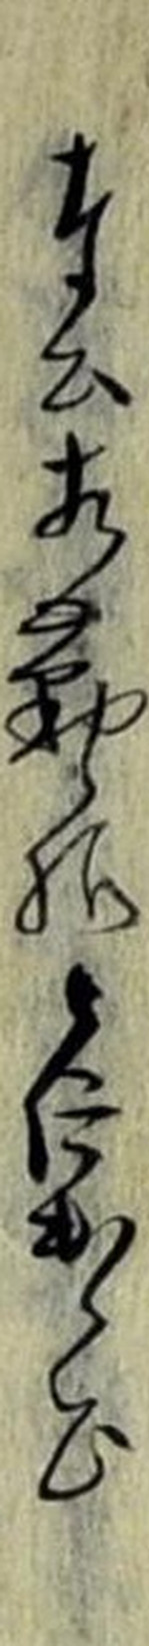奉公相勤候様被仰出候以上
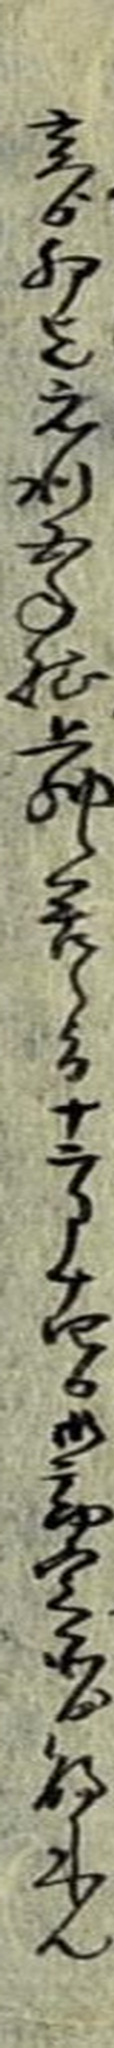亥ゟ卯迄元利五年賦上納候筈之旨十二月十四日御勘定所ゟ触来る
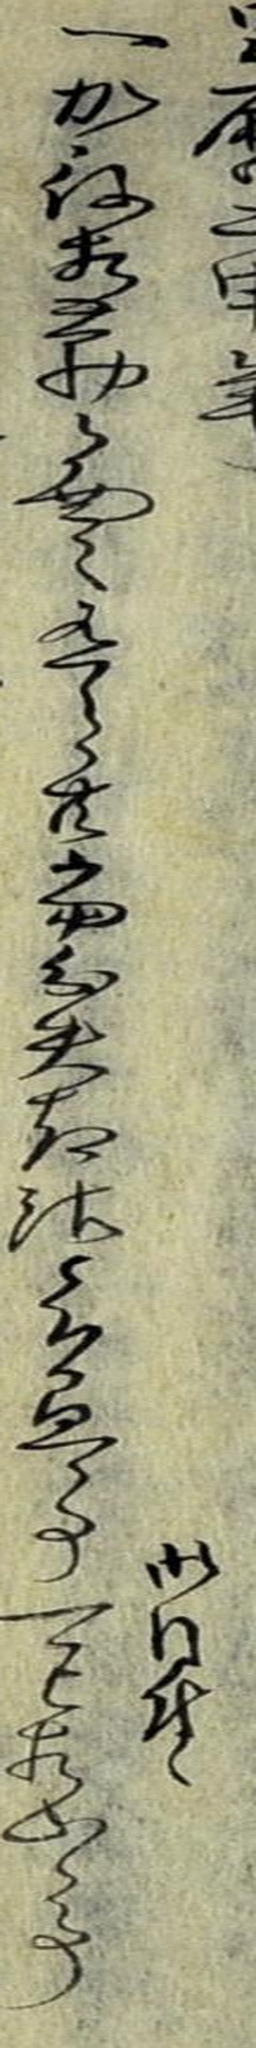一加役相勤之面々有之候共当分失却銀被下置候事可被相止候事
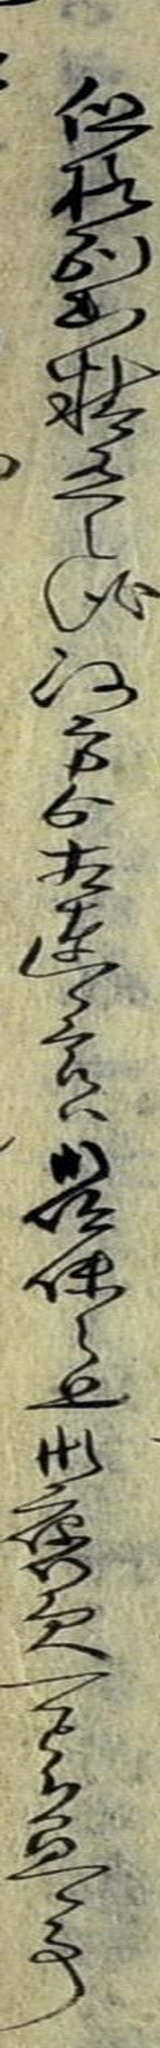但格別出精有之趣役方ゟ相達候節は御吟味之上御褒美可被下置候事
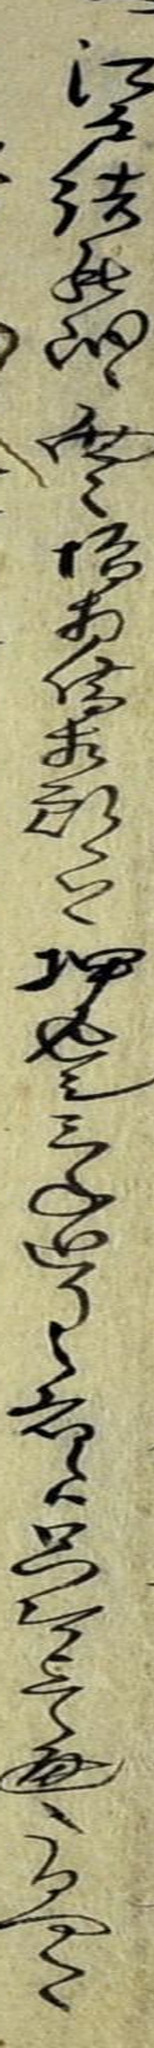一江戸詰罷越候面々増拝借相願候はゝ押返し三年廻り之者へは只今之通たるへく候
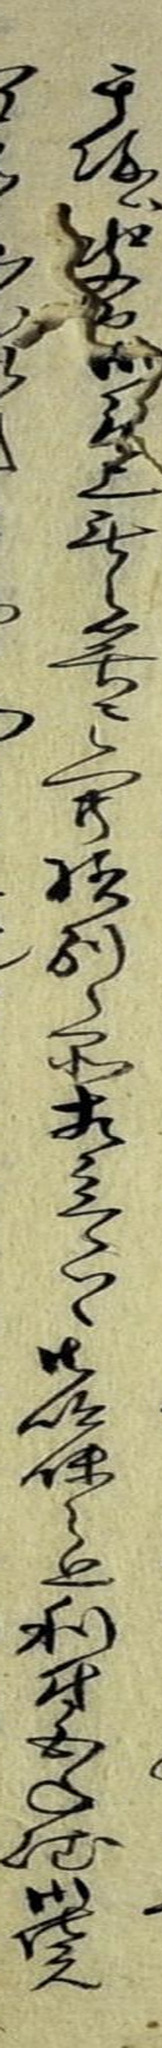其余は決而御取上無之筈に候へ共格別之品相立候はゝ御吟味之上利付五年賦御貸
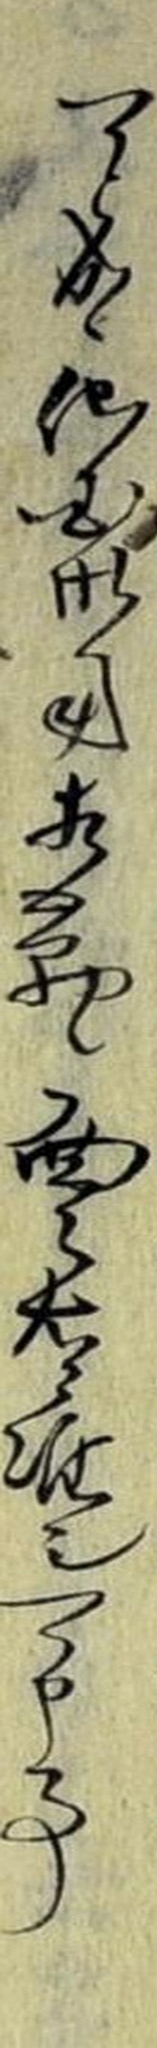可被成候他国御用相勤候面々右に准し可申事
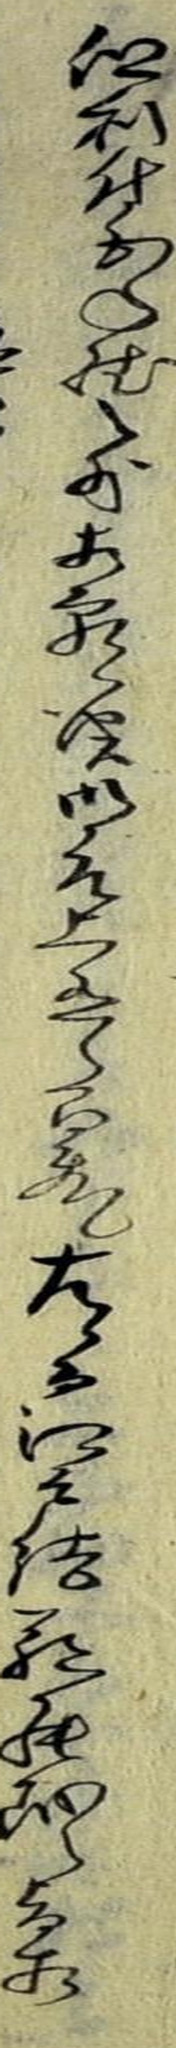但利付五年賦之外相願候儀は御取上有之間敷候左候而江戸詰難罷越候旨相
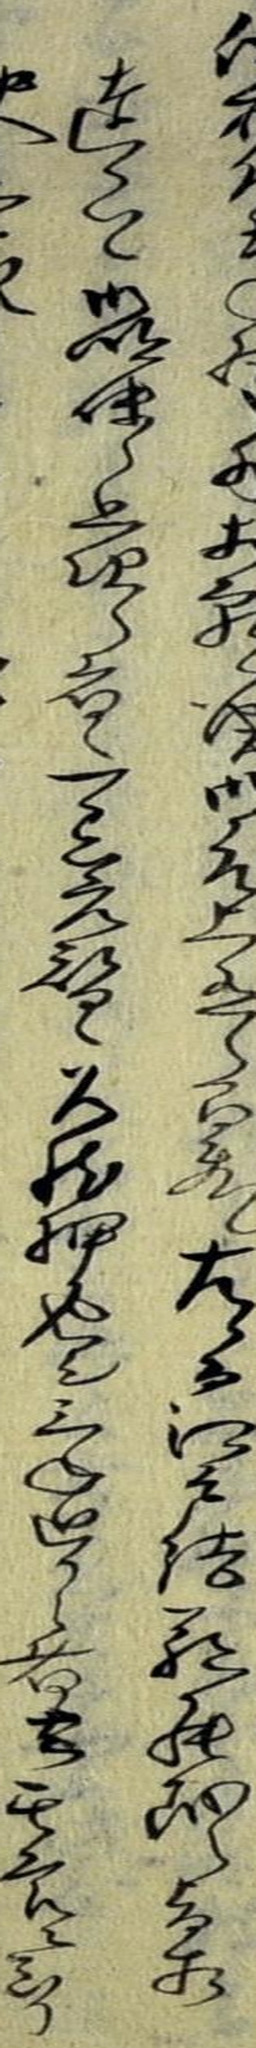達候はゝ御吟味之上次之者へ可被差替候乍然押返し三年廻り之者は其節に至り
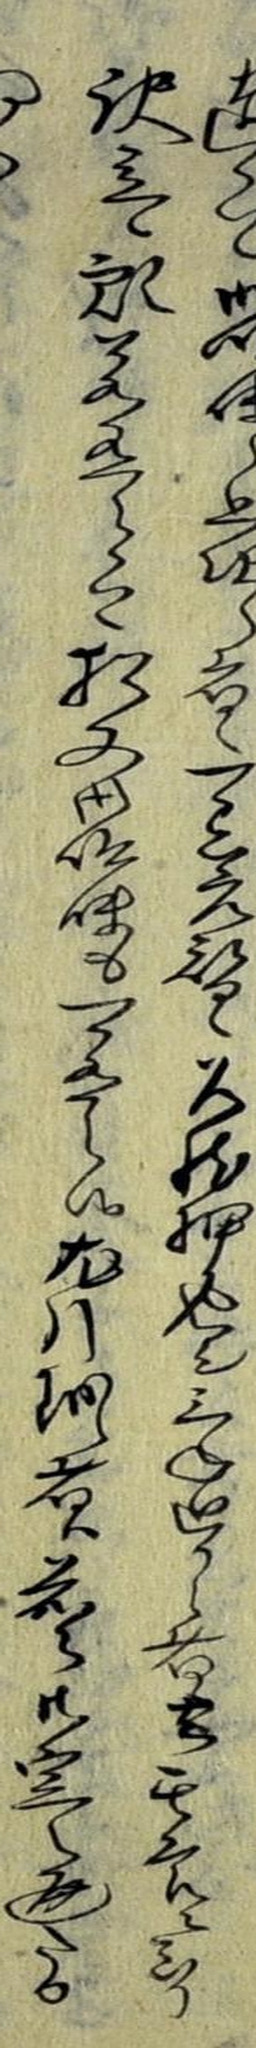訳立候願若有之候はゝ猶又御吟味も可有之候尤引越候者は前々之御定之通たる
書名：命令之部 二
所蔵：福井県文書館 Fukui Prefectural Archives
